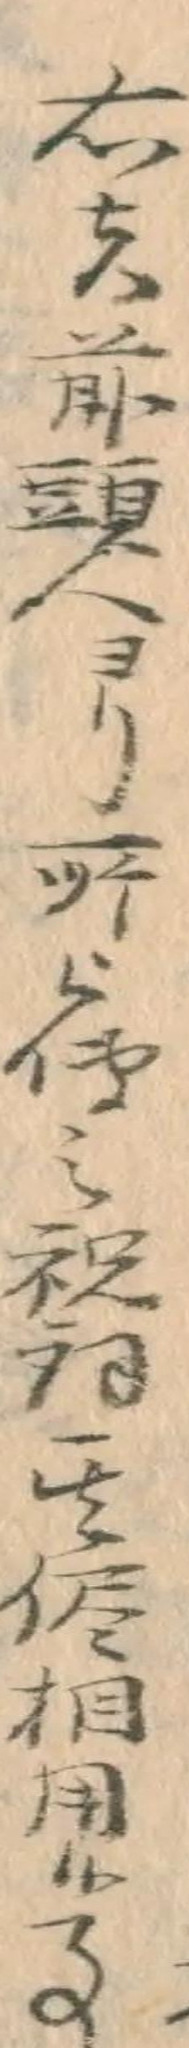右は前頭人より所被仰之祝詞其侭相用候事
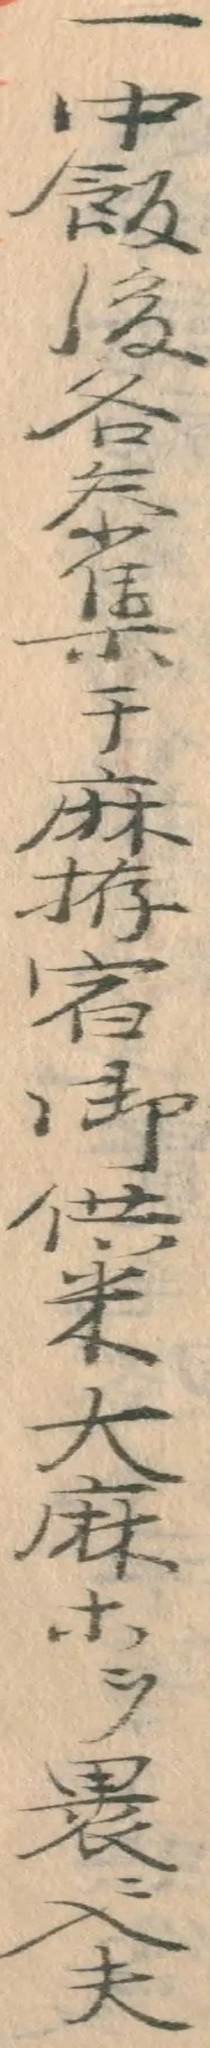一中飯後各参集于麻拵宿御供米大麻等ヲ裹ニ入夫
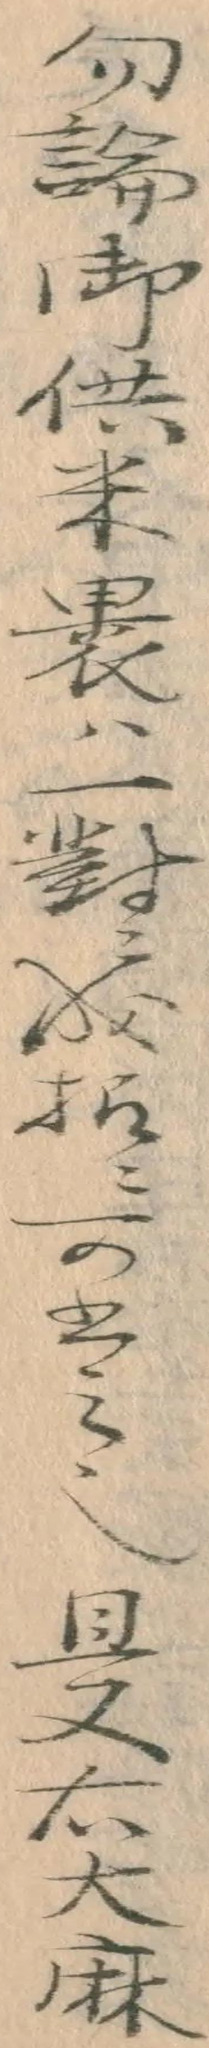勿論御供米褁ハ一對ニ成様ニ可書之也且又右大麻
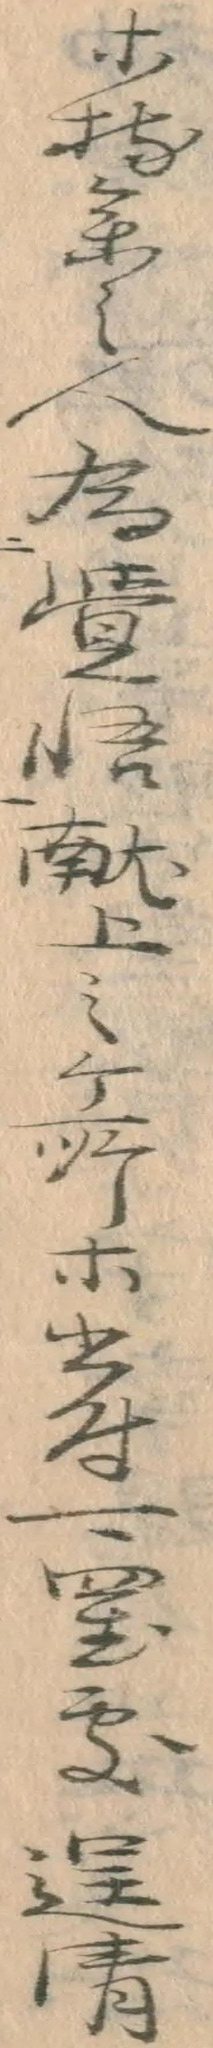等持参之人為覚悟献上之ケ所等書付可置處逞清
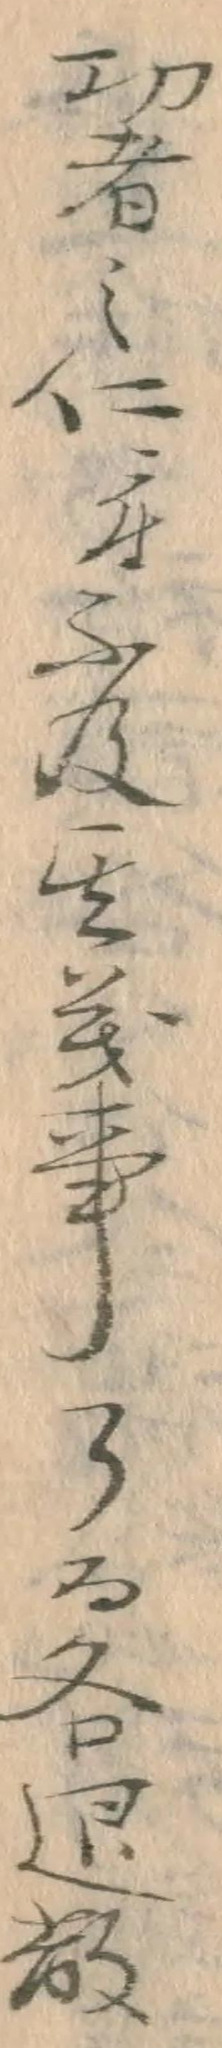功者之仁ニ付不及其義事了而各退散
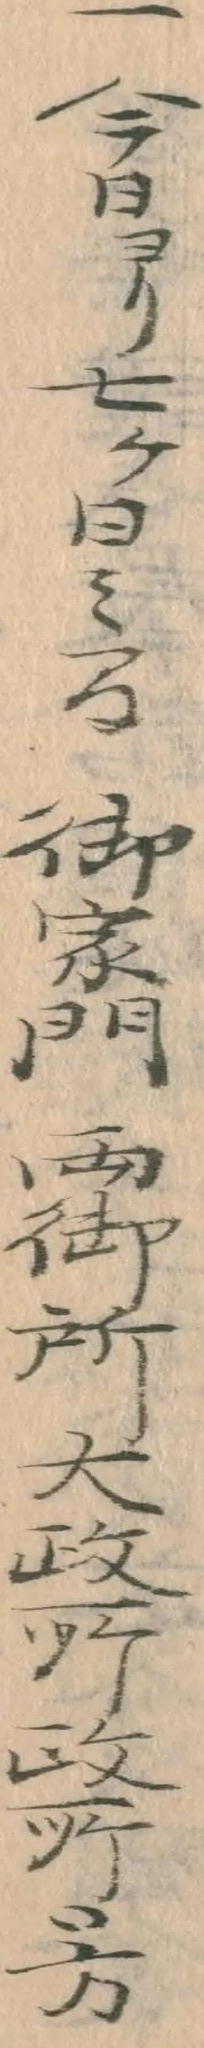一今日ヨリ七ヶ日之間御家門両御所大政所政所御方
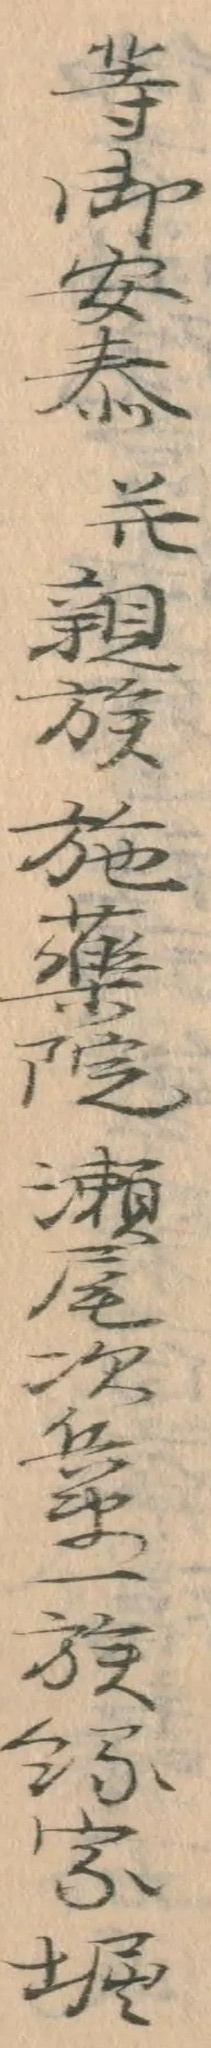等御安泰并親族施薬院瀬尾次兵衛一族縁家堀
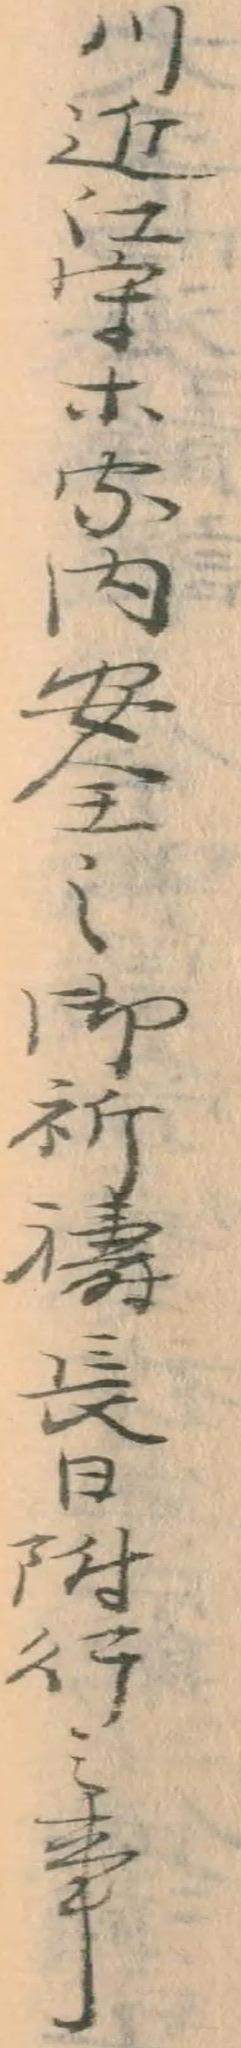川近江守等家内安全之御祈祷長日附行之事
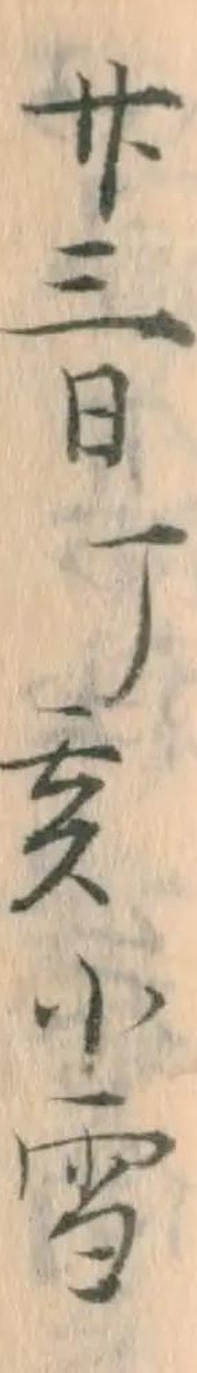廿三日丁亥小雪
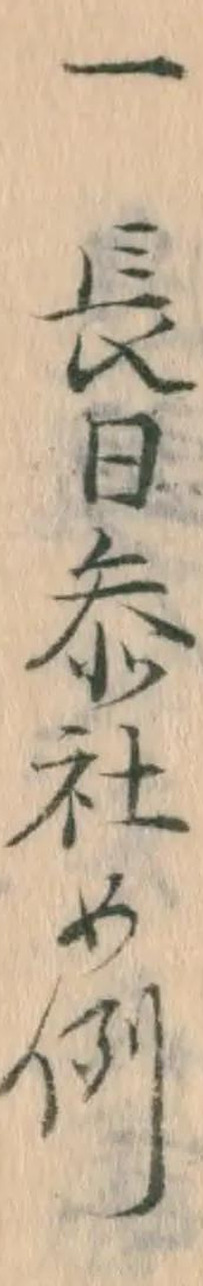一長日参社如例
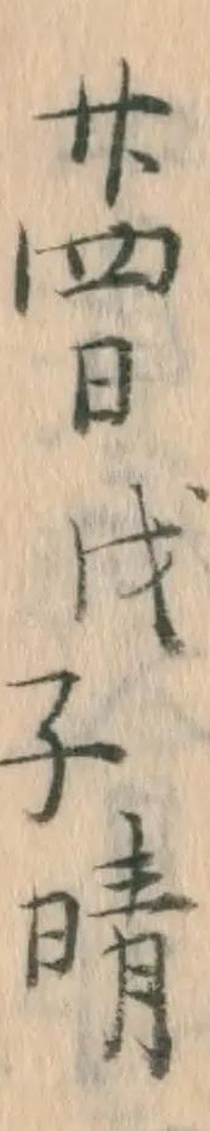廿四日戊子晴
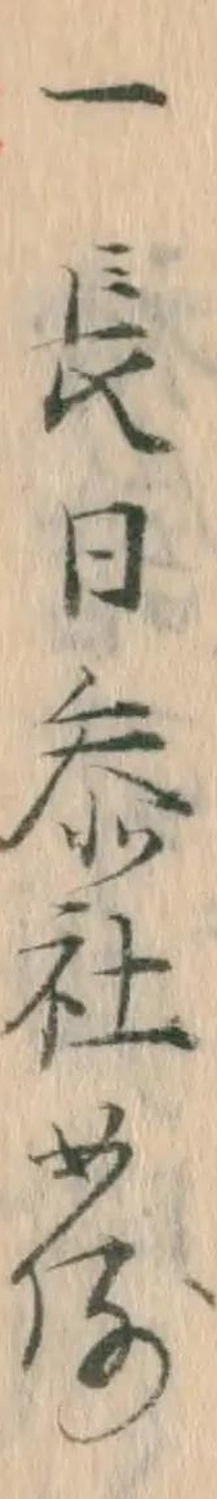一長日参社如例
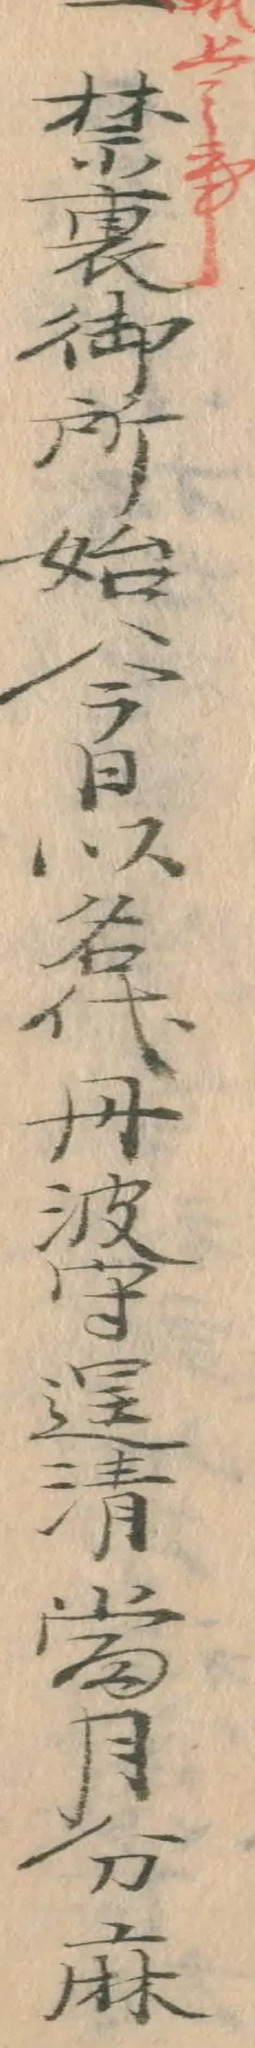一禁裏御所始へ今日以名代丹波守逞清當月分麻
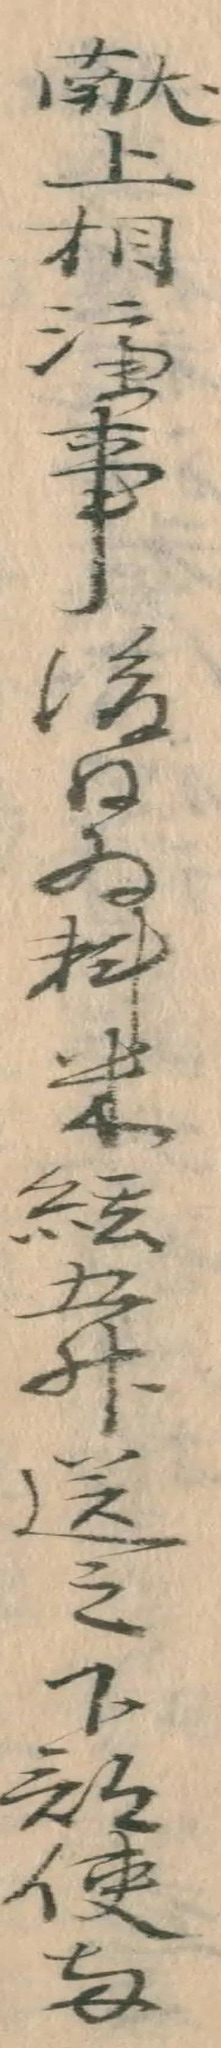献上相済事後日為料米糕五升送之下部使両
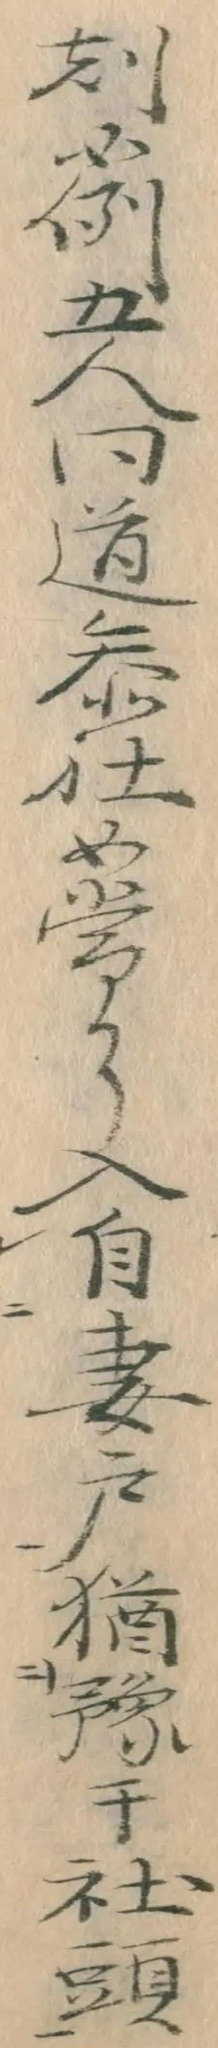刻如例五人同道参社如常終了入自妻戸猶豫于社頭

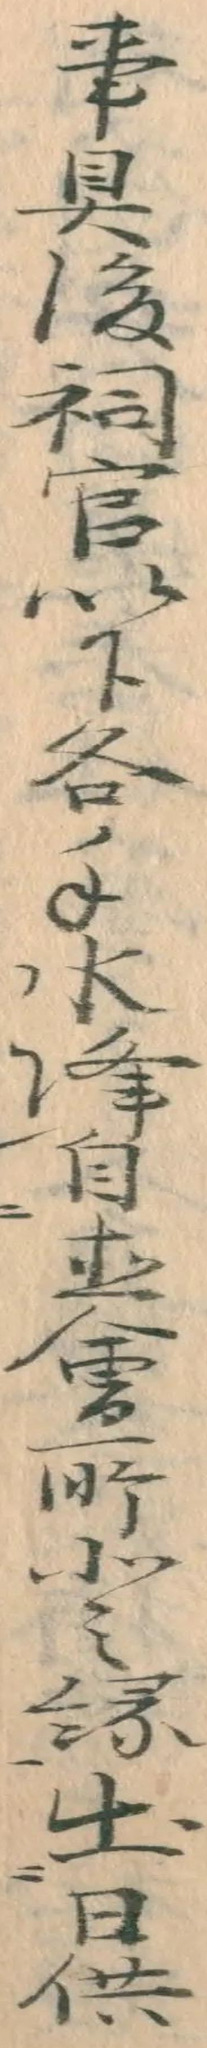事具後祠官以下各手水降自直會所北之縁出日供
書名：賀茂社記録. 第72冊
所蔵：国立国会図書館 National Diet Library, JAPAN
